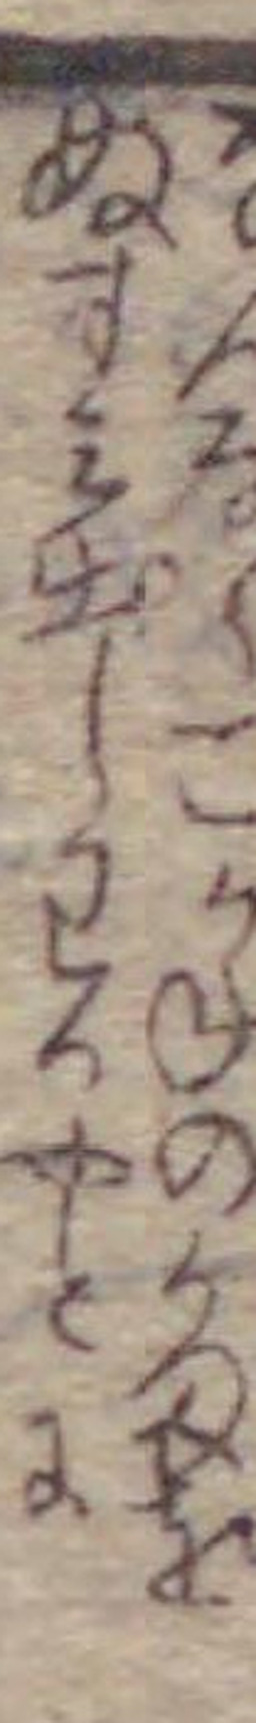ぬすみ出しわかやとに
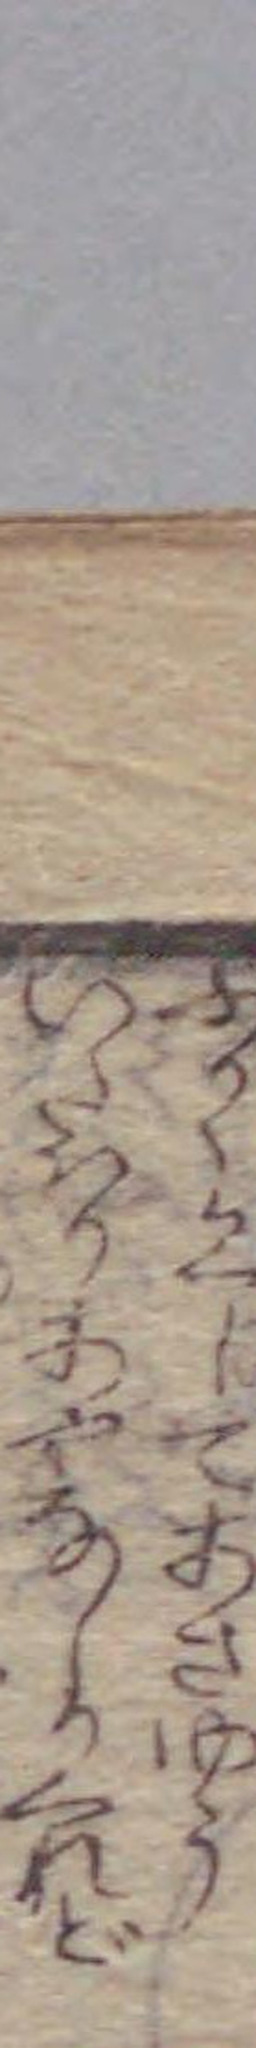いたはりあやなしかくれど
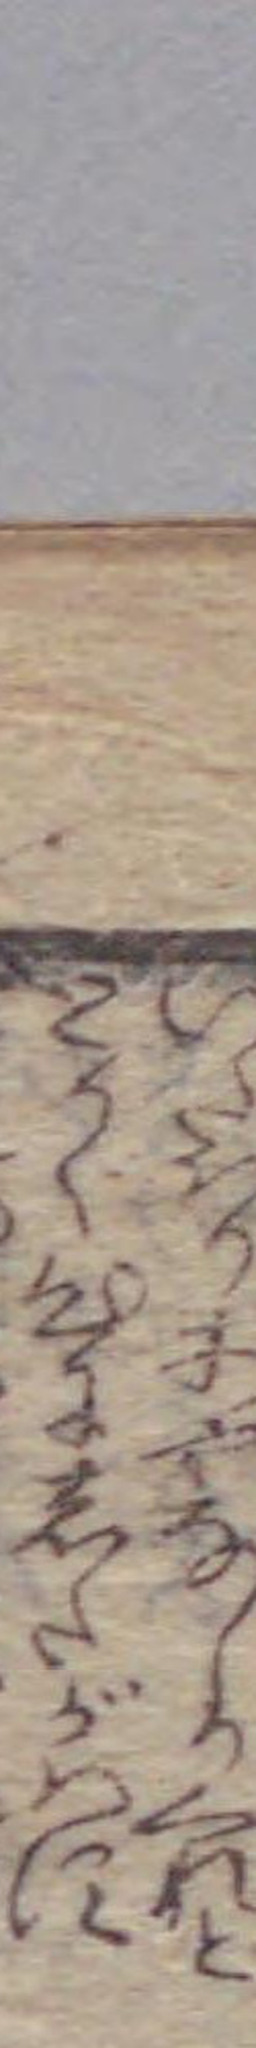とかく心にしたがはす
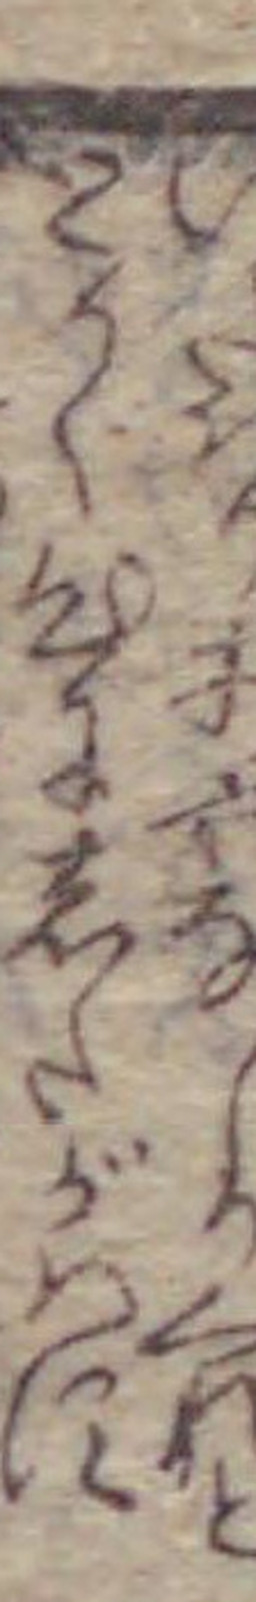とかく心にしたがはす
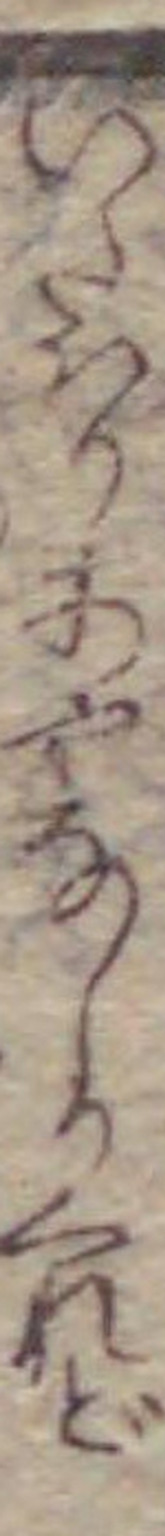いたはりあやなしかくれど
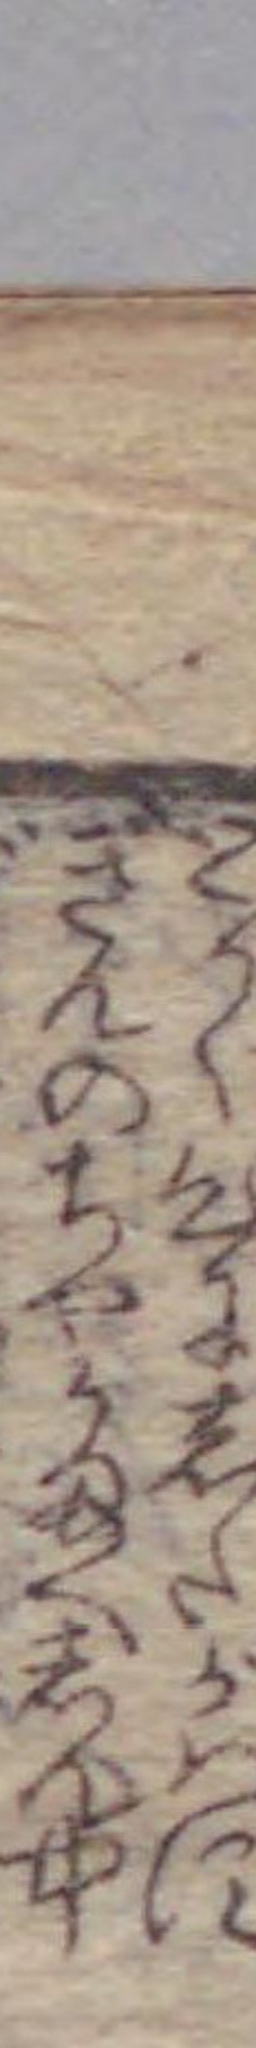ぎんのちやかまへしん中
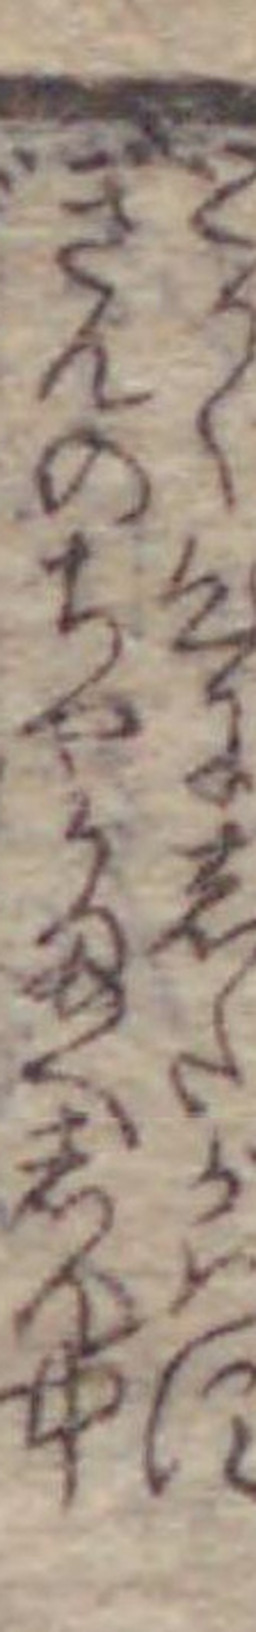ぎんのちやかまへしん中
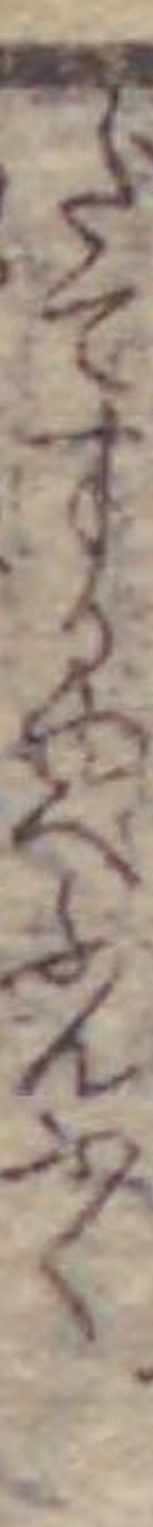だてするゆへふんふく
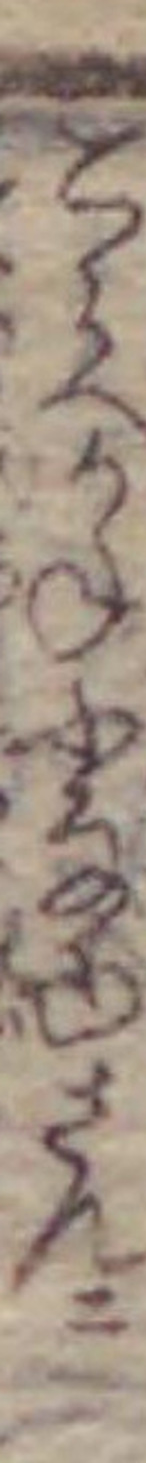こらへかねふなゆさんに
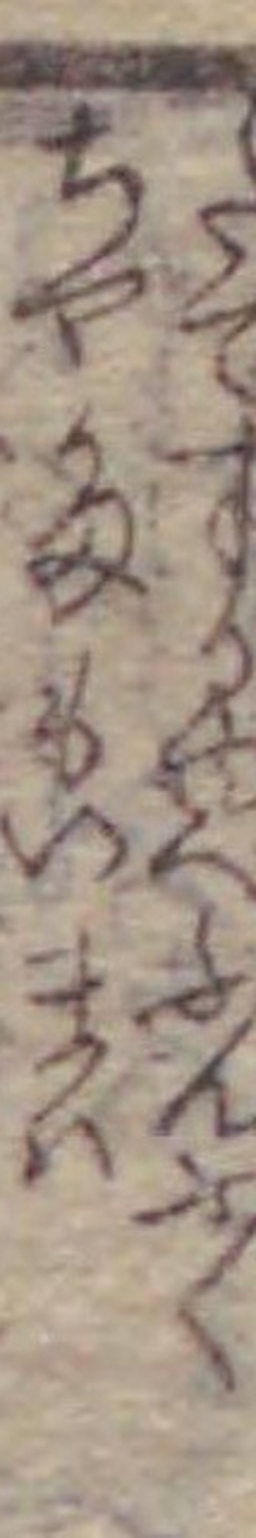ちやかまもいまは
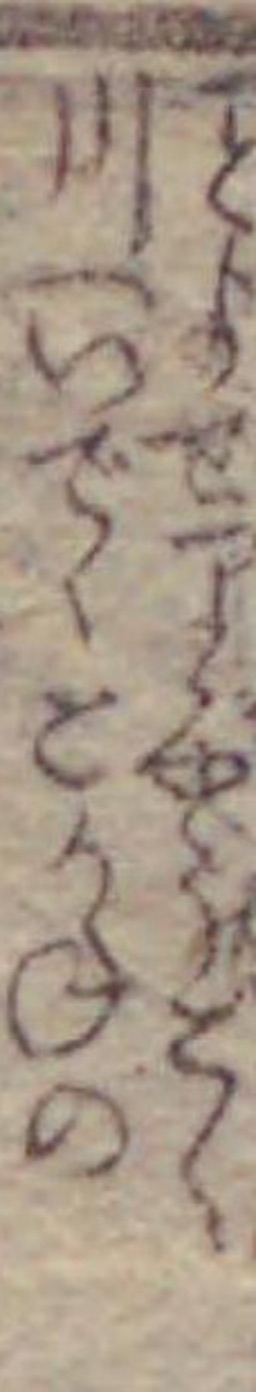川へいでゝこかねの
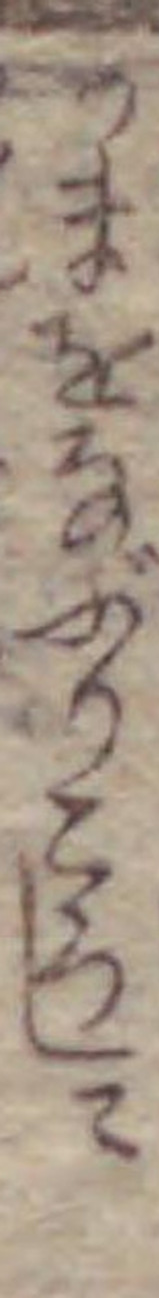かまをなぶりころしに
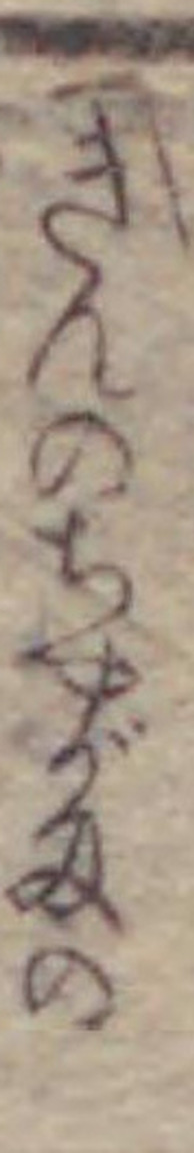〽きんのちやがまの
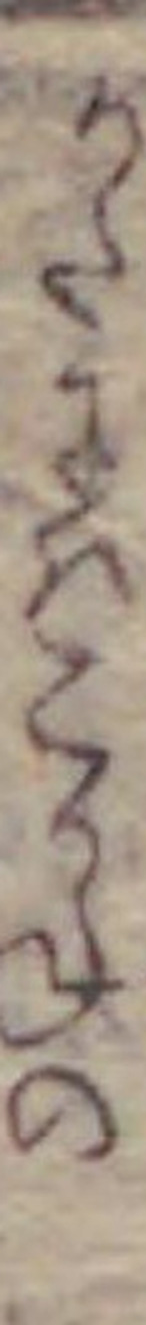かたにはこかねの
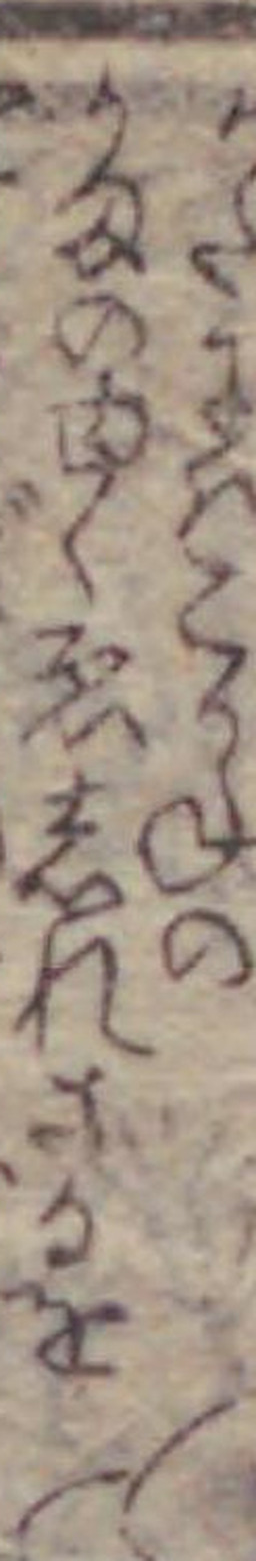かまのゆくゑしれさるを
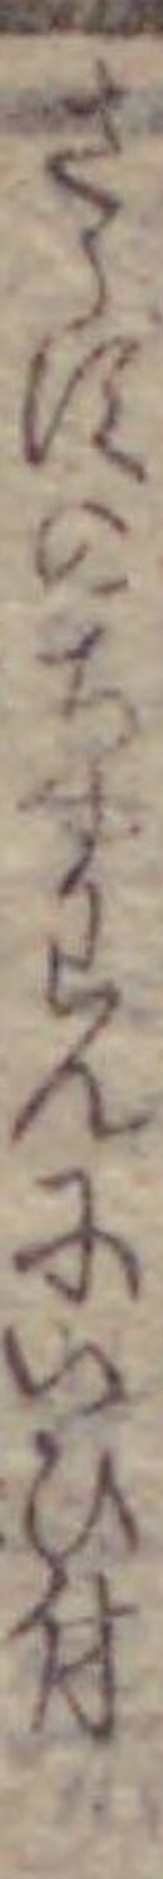さらずのちやわんにいひ付
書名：万物小遣帳 : 2巻
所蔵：国立国会図書館 National Diet Library, JAPAN
